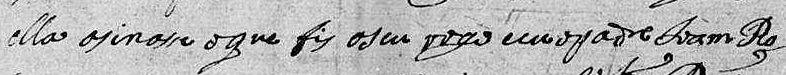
ella asinasse o que fis a seu rogo e eu o padre Ioam Ro
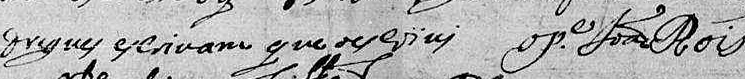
drigues escrivam que o escriuj o p.e Ioaõ Rois̄
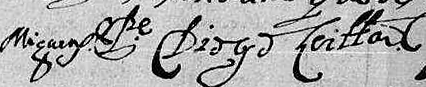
Miguens o P.e Diogo Leittaõ
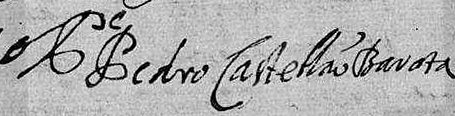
o P.e Pedro Castellaõ Barata
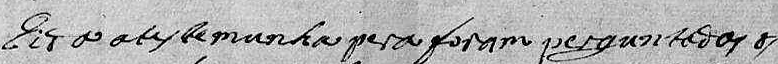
E ida a testemunha pera foram perguntados os
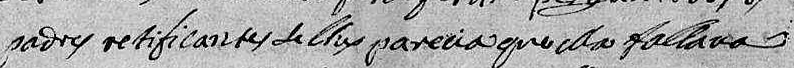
padres retificantes se lhes parecia que ella fallava
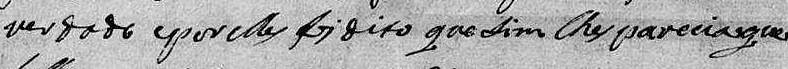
verdade e por elles foi dito que sim lhes parecia que
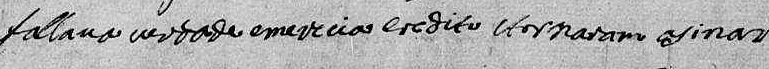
fallaua uerdade e merecia credito e tornaram asinar
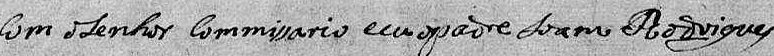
com o Senhor Commissario e eu o padre Ioam Rodrigues
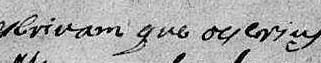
escrivam que o escriuj
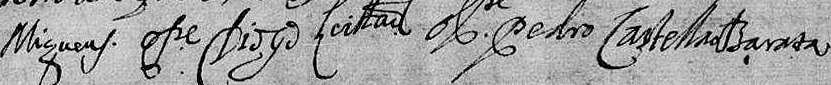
Miguens. o P.e Diogo Leittaõ o P.e pedro Castellaõ Barata
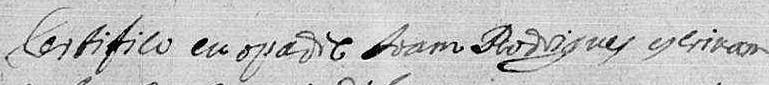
Certifico eu o padre Ioam Rodrigues escrivam
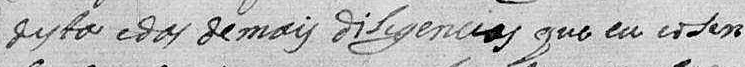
desta e das demais diligencias que eu e o sen
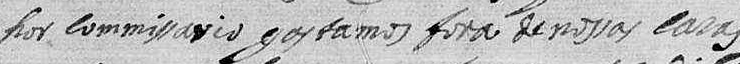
hor commissario gastamos fora de nossas cazas
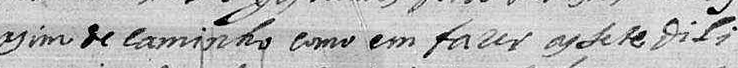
asim de caminho como em fazer as sete dili
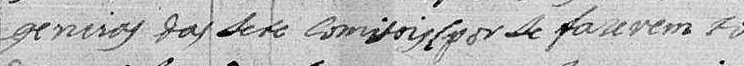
gencias das sete comisois (por se fazerem to
